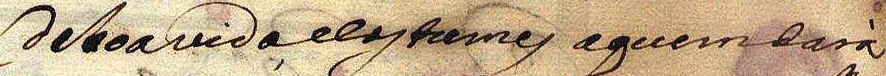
de boa vida, e costumes a quem darà
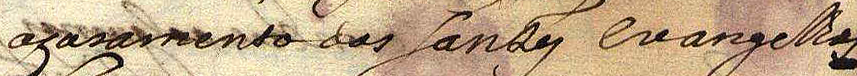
o juramento dos santos evangelhos
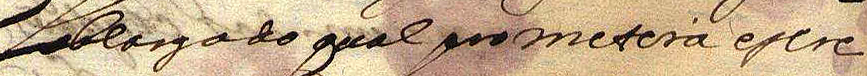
sob cargo do qual prometera escre
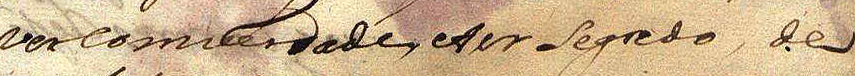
ver com verdade, e ter segredo, de
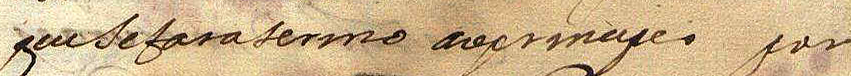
que se fara termo ao principio por
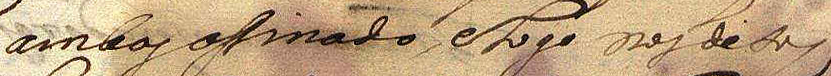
ambos assinado, e Logo nos ditos
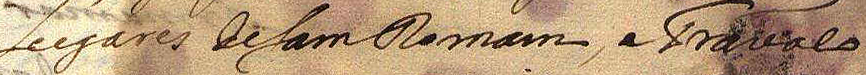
Lugares de Sam Romam, e Travaco
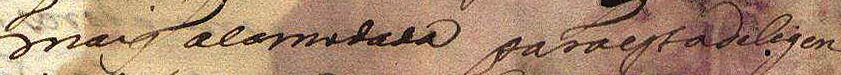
mais acomodada para esta deligen
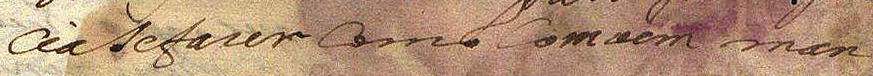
cia se fazer como comvem man
